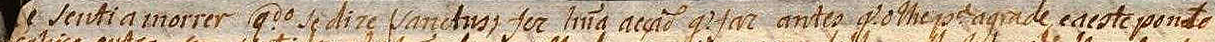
e senti a morrer q.do se dize sanctus, fez hūa acçaõ q̄. faz antes q̄. olhe p.a a grade e a este ponto
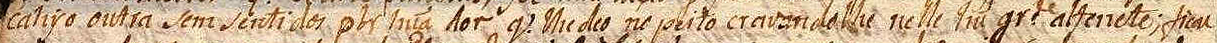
cahyo outra sem sentidos por hūa dor q̄. lhe deo no peito cravandolhe nelle hū gr.de alfinete; ficou
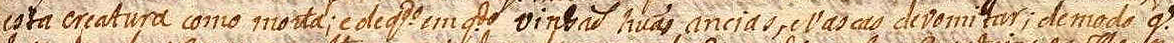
esta creatura como morta; e de q.do em qdo vinhaõ huās ancias, e Vascas de vomitar; de modo q̄.
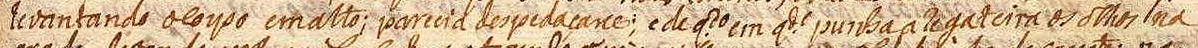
levantando o corpo em alto; parecia despedaçarce; e de q.do em q.do punha a Regateira os olhos na
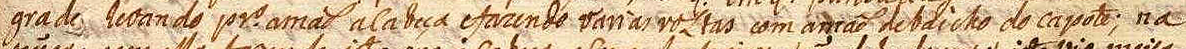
grade levando pr.o a maõ a Cabeça e fazendo varias voltas com a maõ debaicho do capote; na
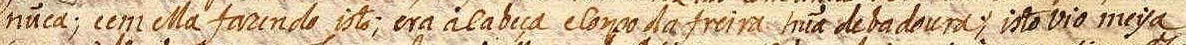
nūca; e em ella fazendo isto; era a Cabeça e Corpo da freira huā debadoura; isto vio meya
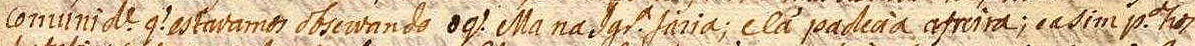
comunid.e q̄. estavamos observando o q̄. ella na Igr.a fazia; e lá padecia a freira; e asim p.a nos
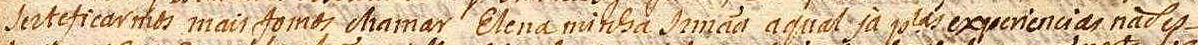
serteficarmos mais fomos chamar Elena minha Irmaã a qual já plas experiencias naõ es
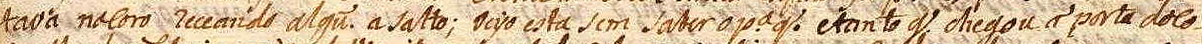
tava no coro receando algū. asalto; veyo esta sem saber o p.a q̄. e tanto q̄ chegou á porta do co
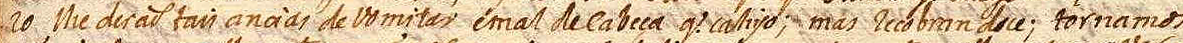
ro lhe deraõ tais ancias de vomitar e mal de cabeça q̄ cahyo; mas Recobrandoce; tornamos
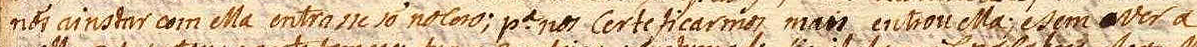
nós a instar com ella entrasse só no coro; p.a nos certeficarmos mais entrou ella; e sem a ver a
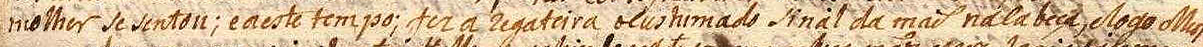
molher se sentou; e a este tempo fez a Regateira o custumado sinal da maõ na Cabeça, e logo olhou
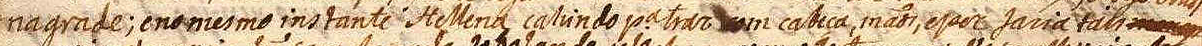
na grade; e no mesmo instante Hellena, cahindo p.a traz com cabeca, maõs, e pez fazia tais _
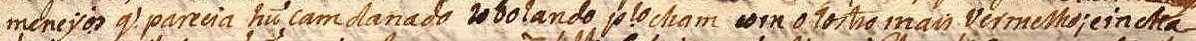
meneyos q̄. parecia hū cam danado Robolando plo cham com o Rostro mais vermelho; e incha
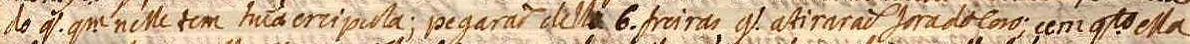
do q̄. qm. nelle tem huā erzipela; pegaraõ della 6. freiras q̄. a tiraraõ fora do coro; e emqto ella
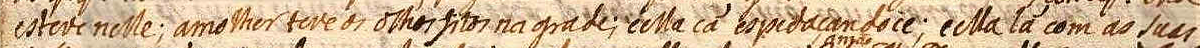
esteve nelle; a molher teve os olhos fitos na grade; e ella cá espedaçandoce; e ella lá com as suas
